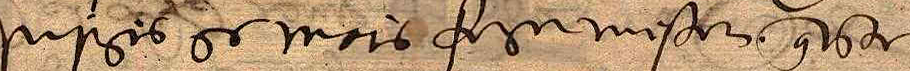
Jujzes se mais fezer mester q̄ este
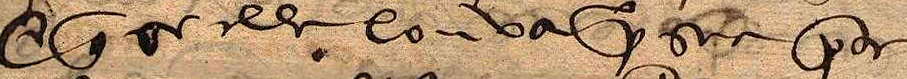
ē q̄ se ella louva p̄o sua p̄te
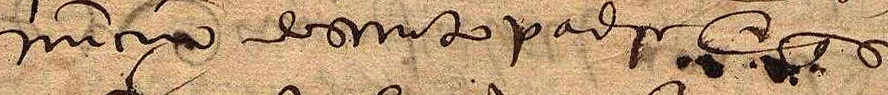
nūcyo do santo padre ē q̄ se
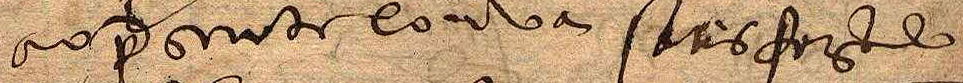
ao p̄sente louva satisfezēdo
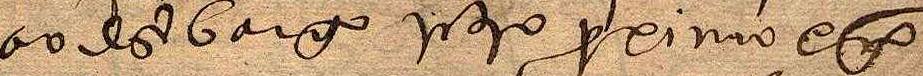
ao desēbargo retro ꝓximo e c̄ꝭ
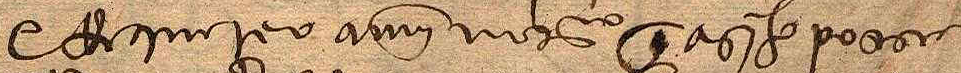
e Requereo a mȳ notro q̄ asj ho posese
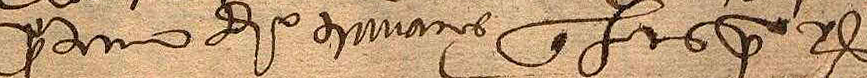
p̄o termo djo trauaços q̄ ho esp̄vy
